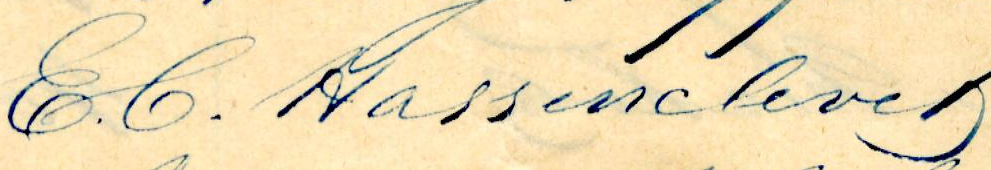E.C. Hassencleve
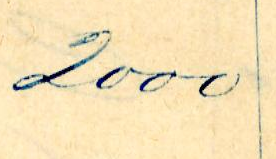2000
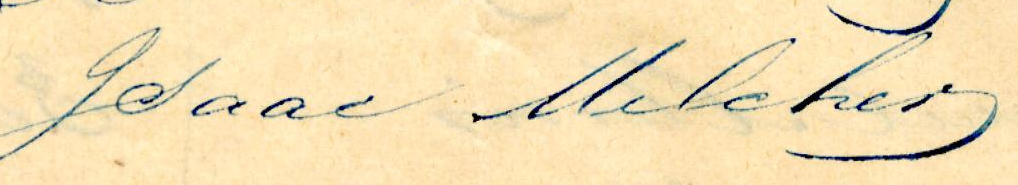Isaac Milcher
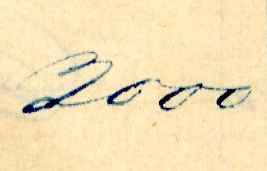2000
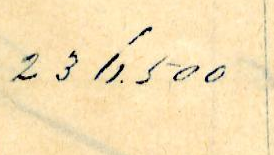236.500
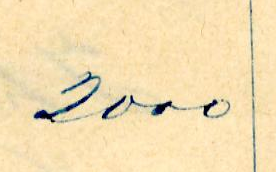2000
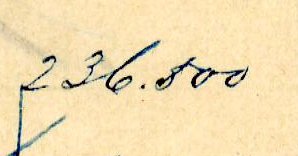236.800
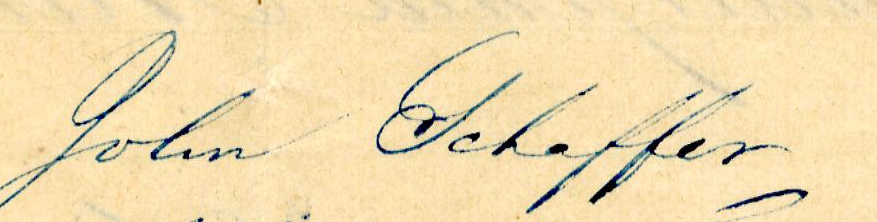John Schaffer
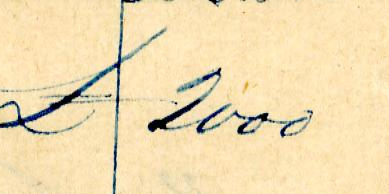£2000
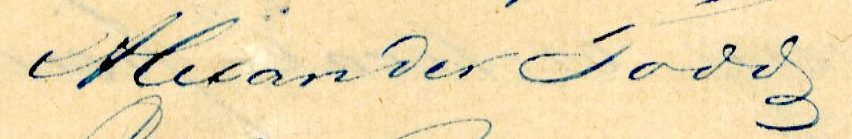Alexander Todd
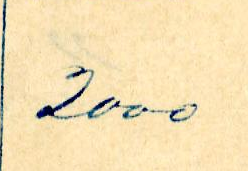2000
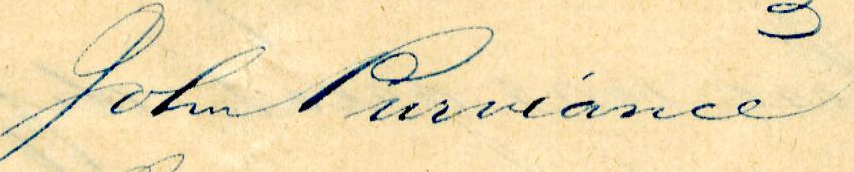John Purviance
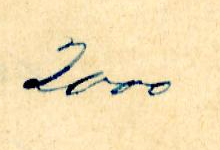2000
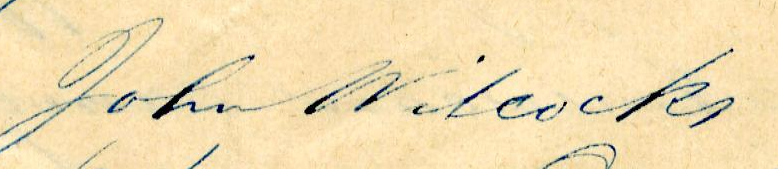John Wilcocks
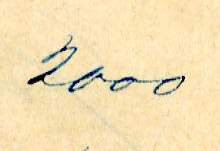2000
